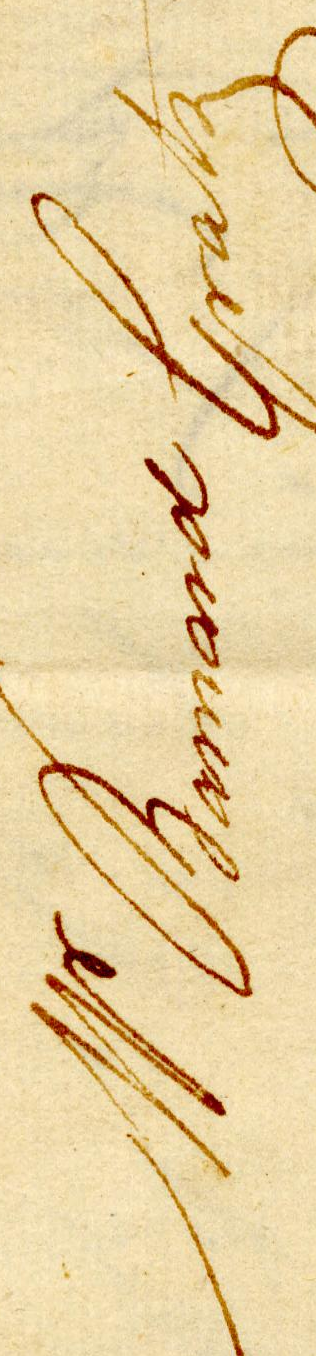M^r Barnard Gratz
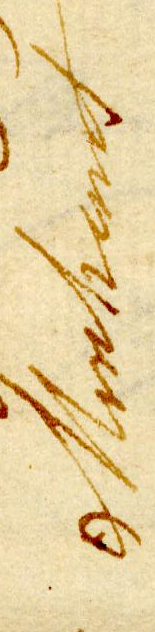Merchant
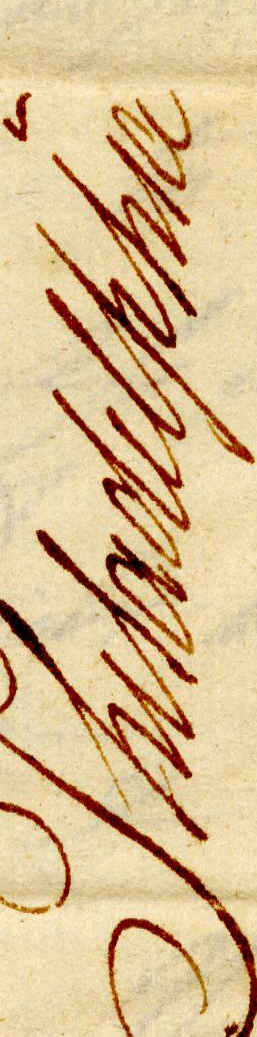Philadelphia
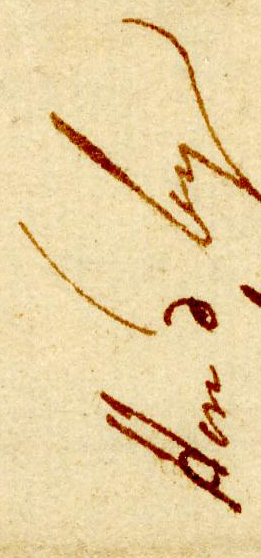Hond by
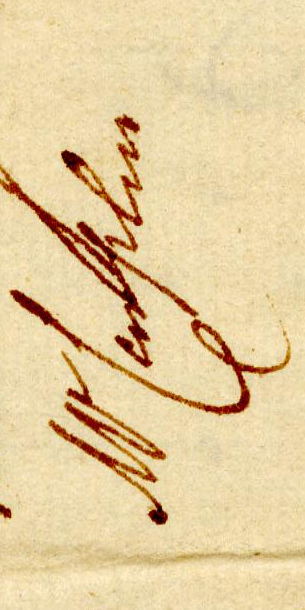M^r Carplus
